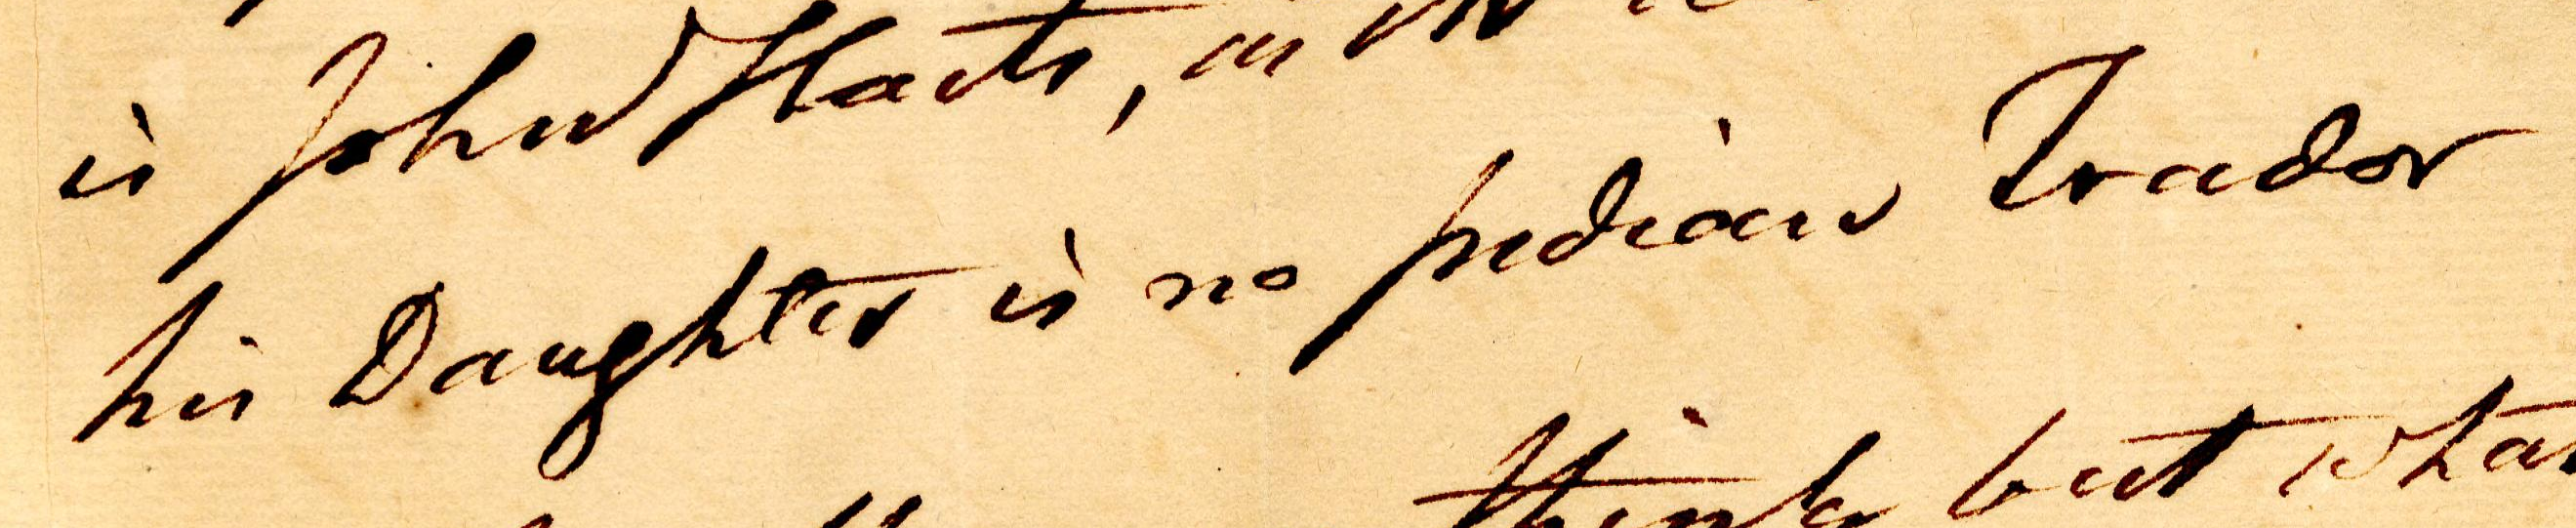his Daughter is no pedious Trader
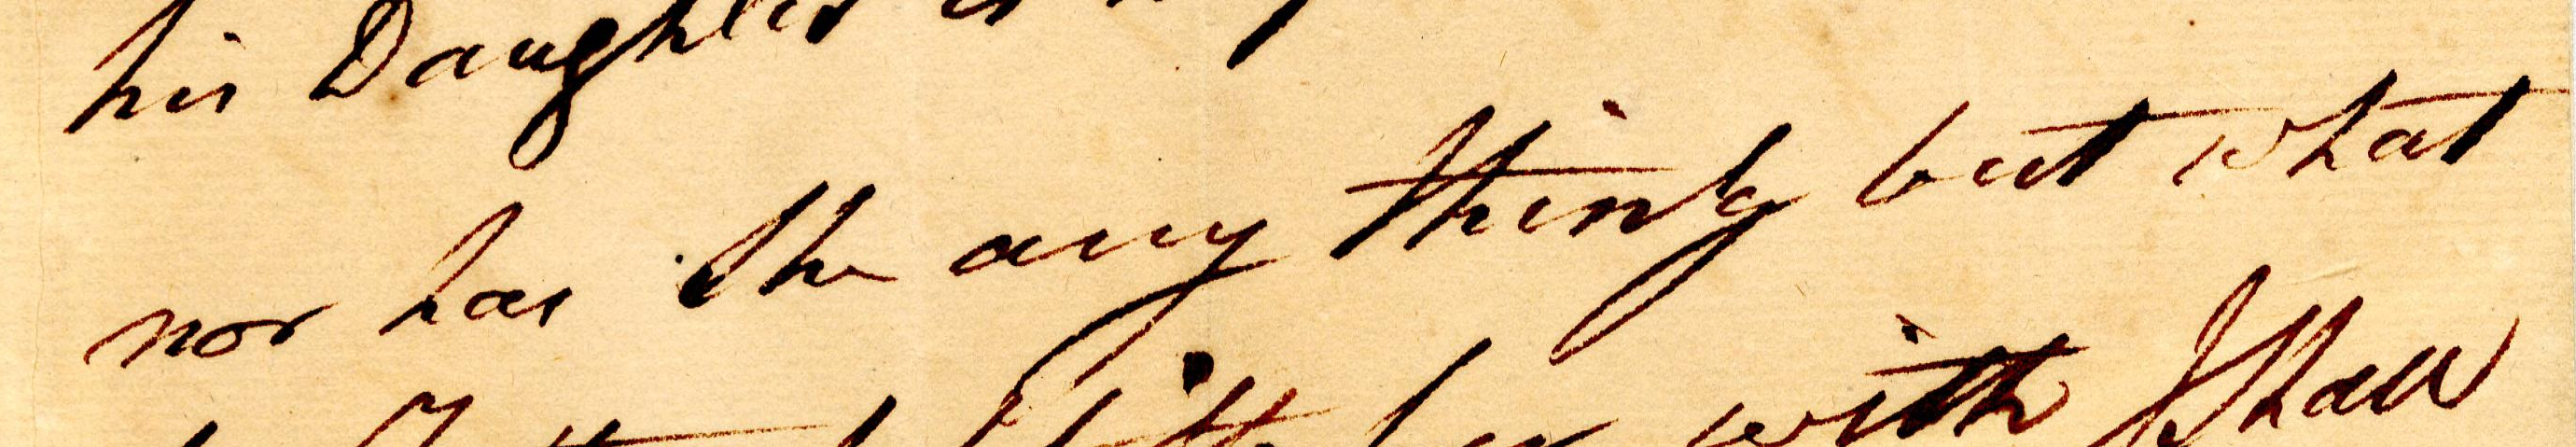nor has she any thing but what
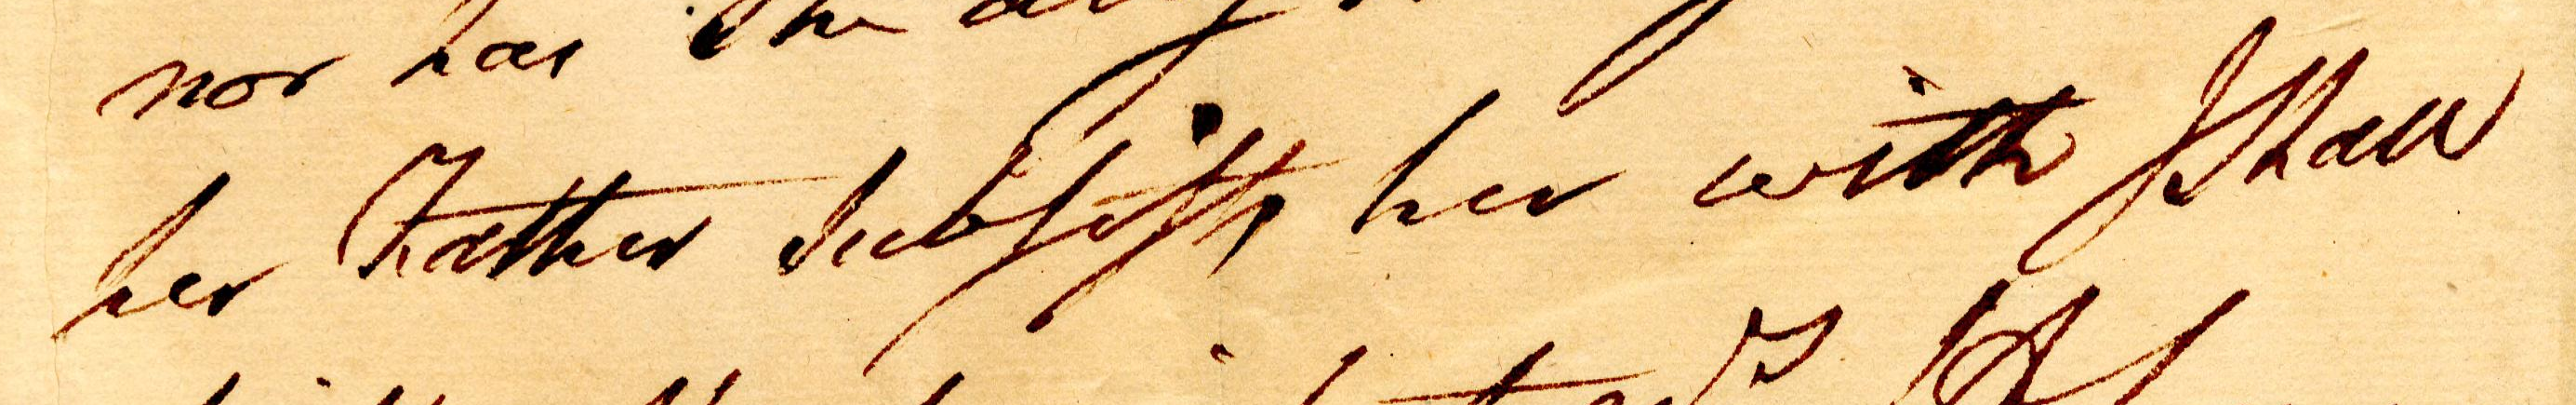her rather subsists her with shall
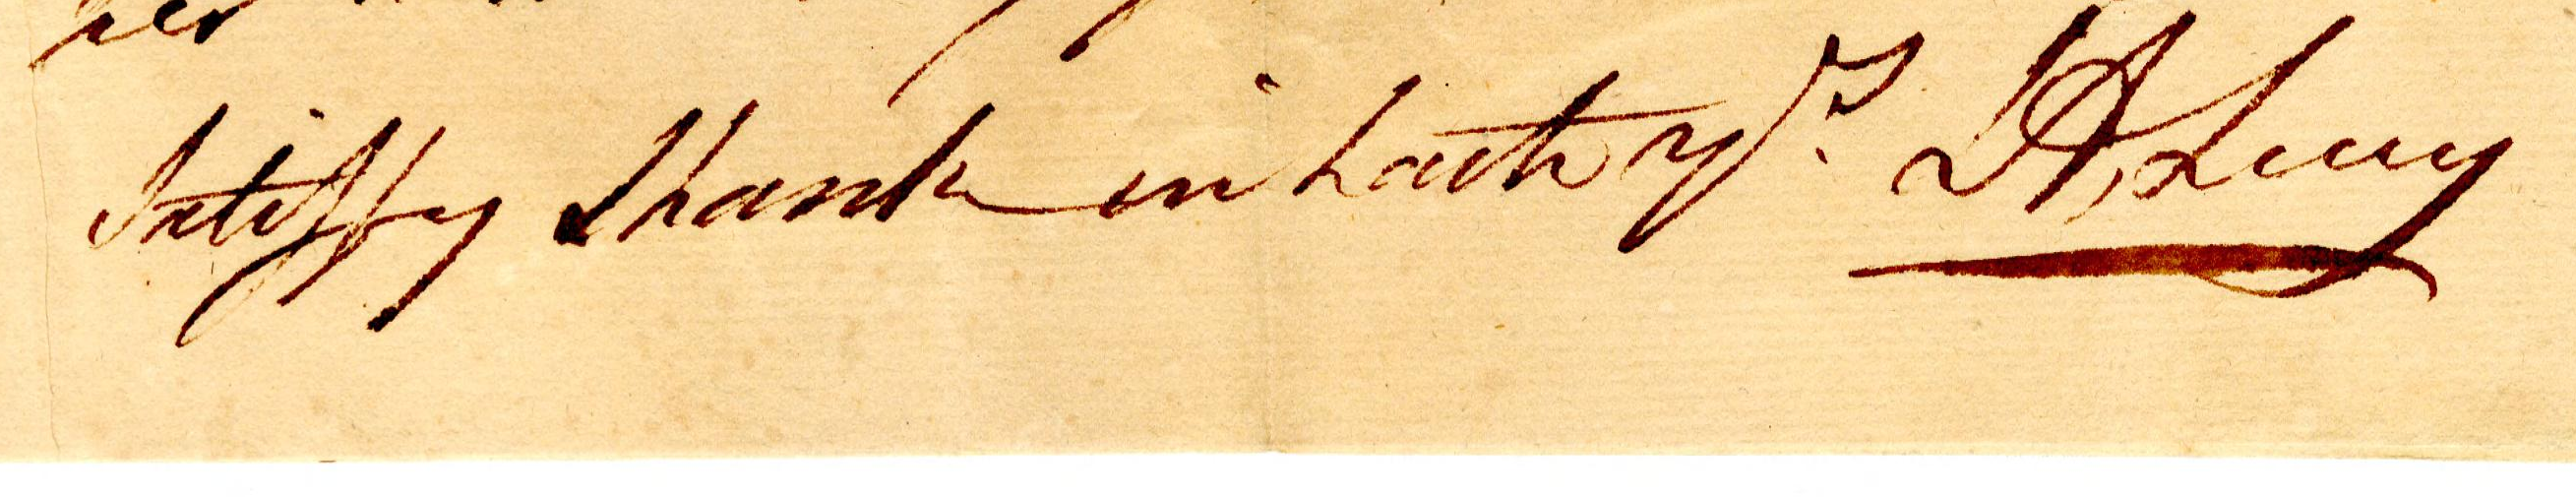Intisty Shank in haste y^r. A, Levy
